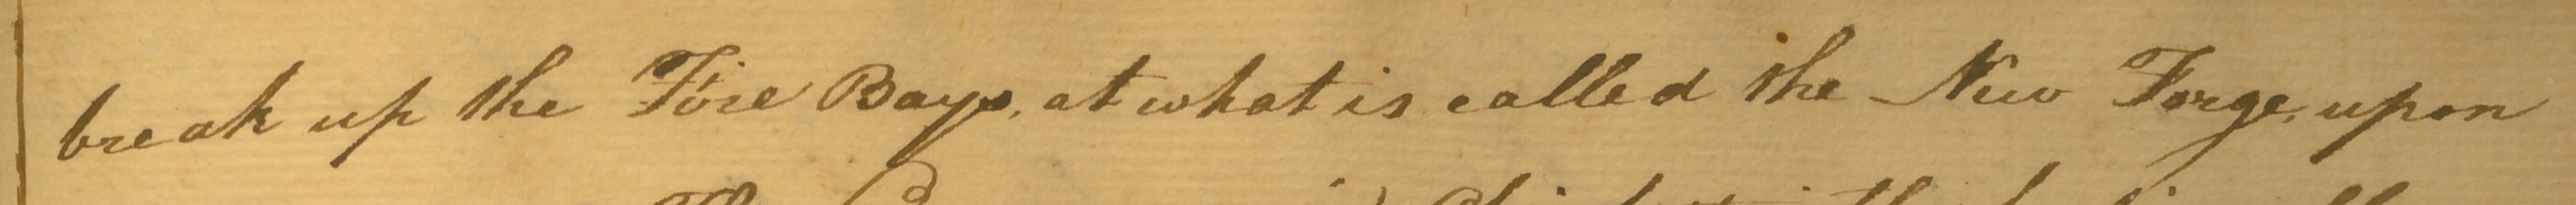break up the Fire Bays at what is called the New Forge upon
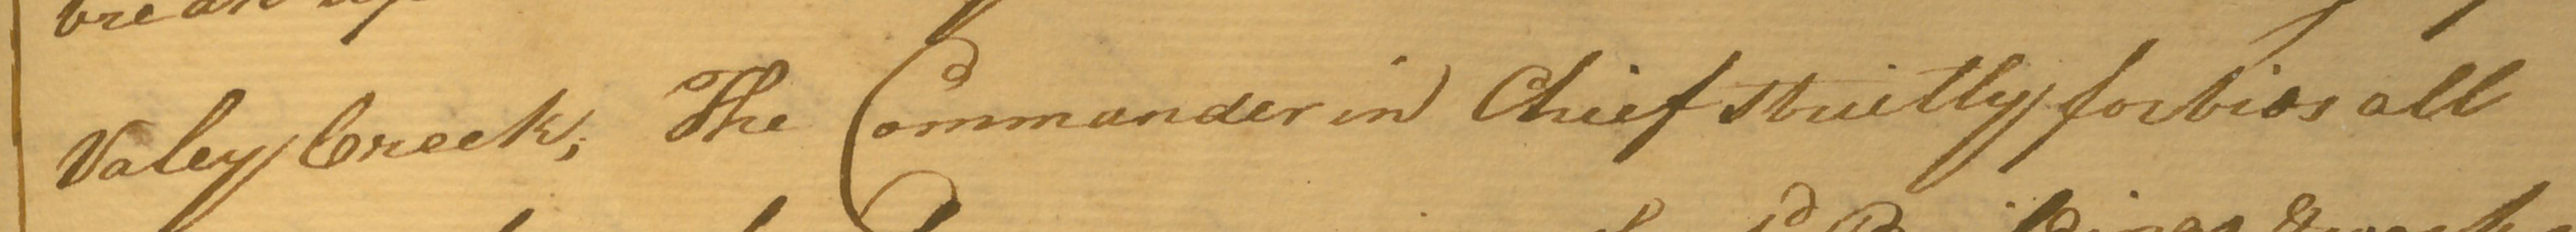Valey break, The Commander in Chief strictly forbids all
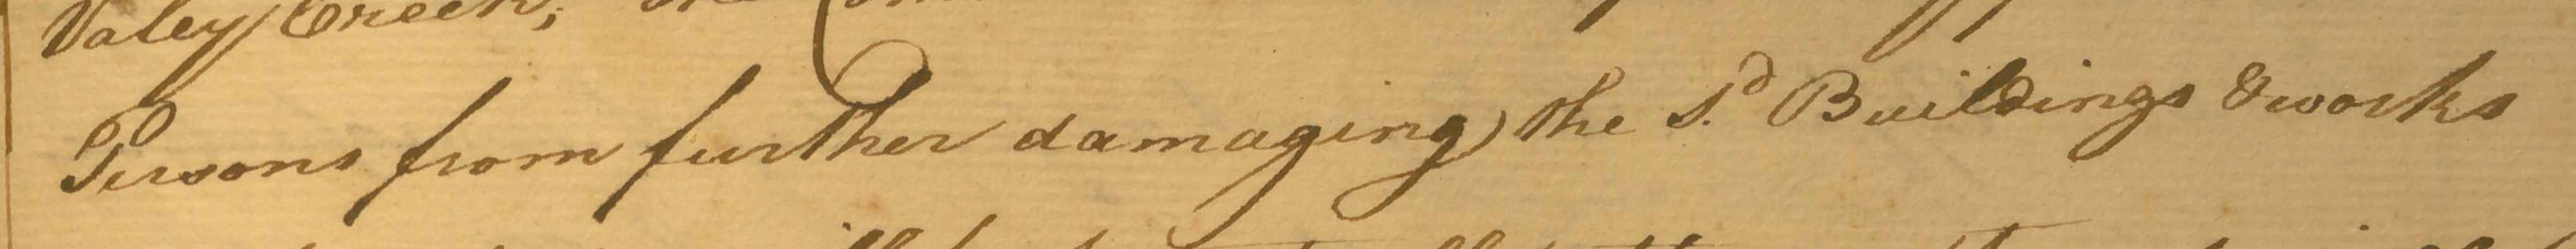Persons from further damaging the s^d. Buildings & works
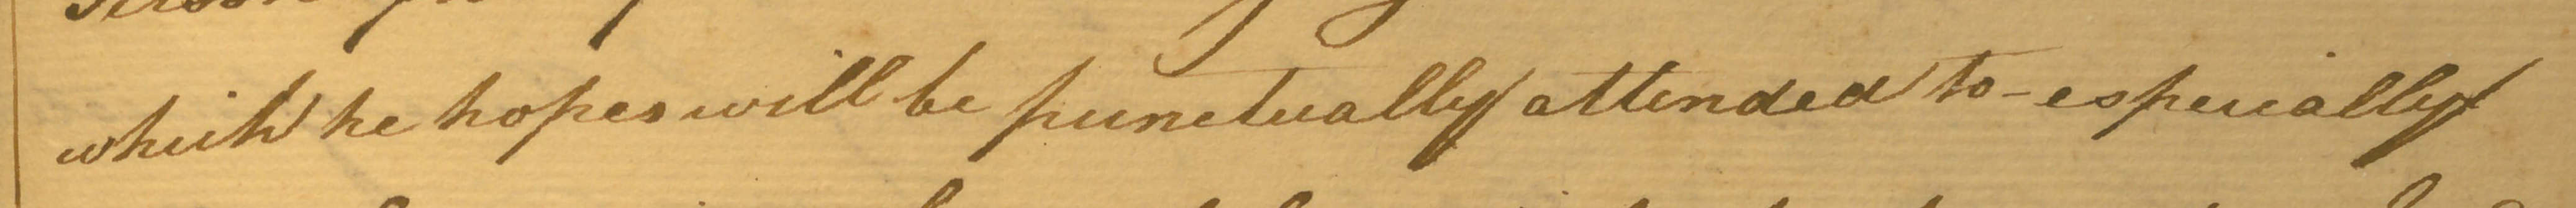which he hopes will be punctually attended to- especially
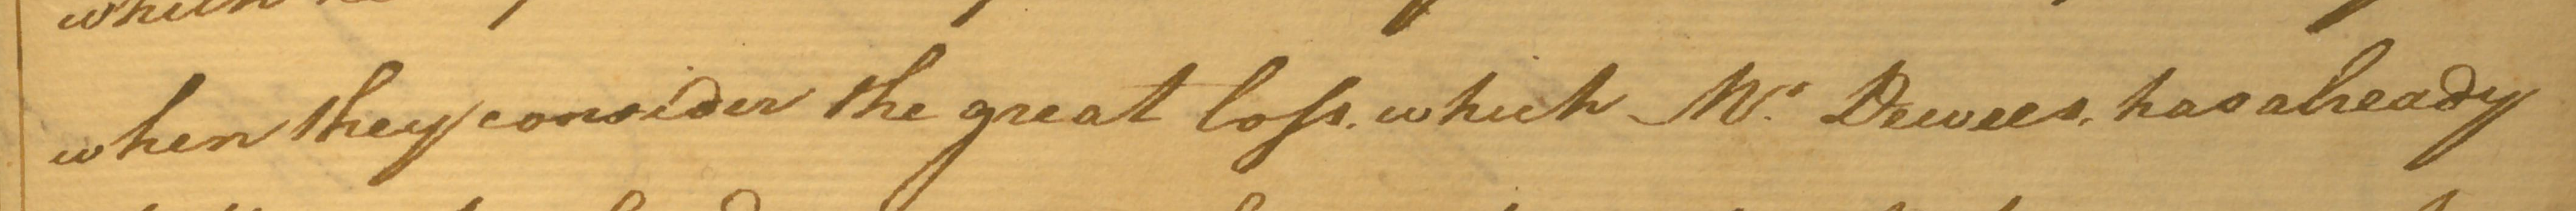when they consider the great loss which M^r. Dewees has already
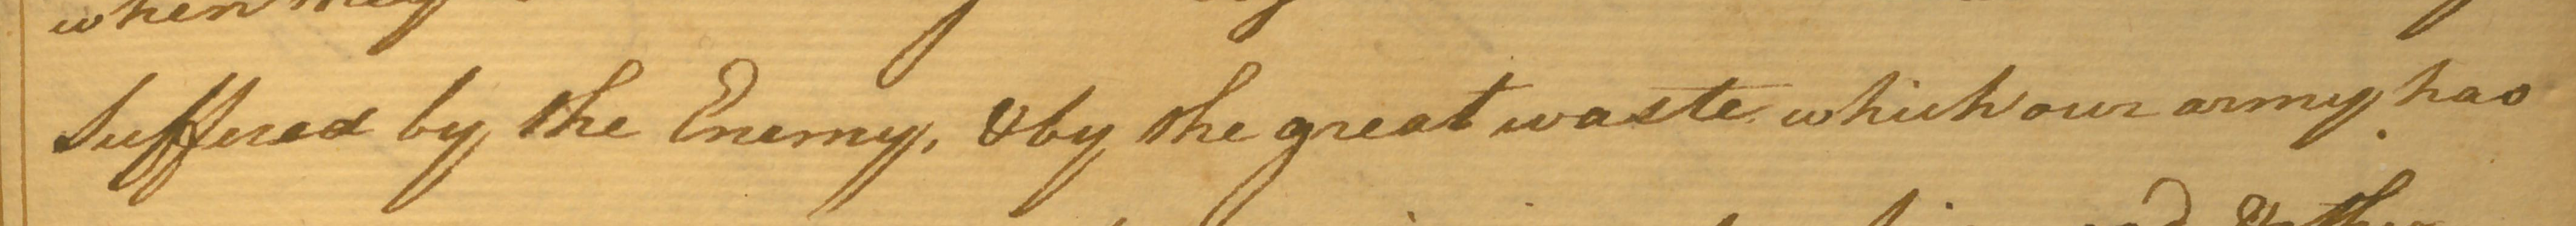Suffered by the Enemy, & by the great waste which our army has
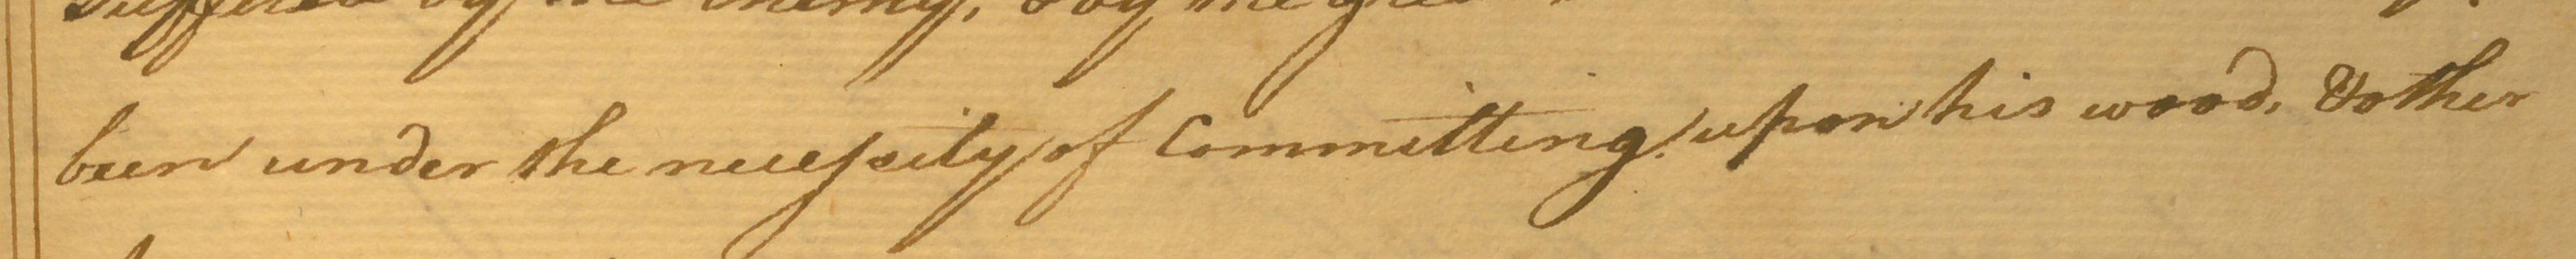been under the necessity of Committing upon his wood & other
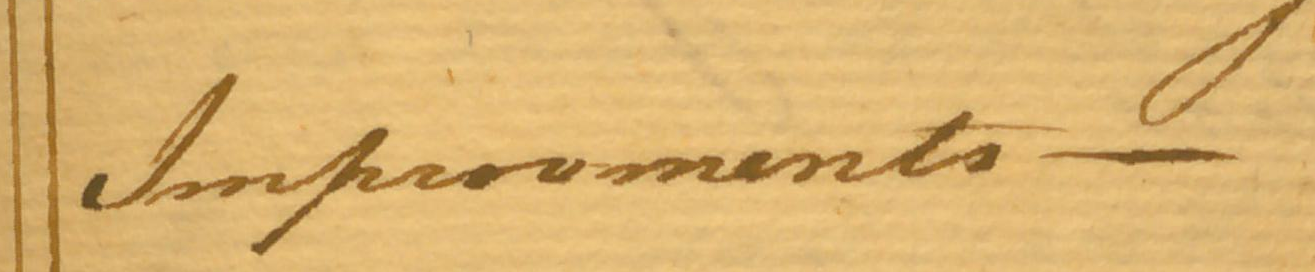Improvements-
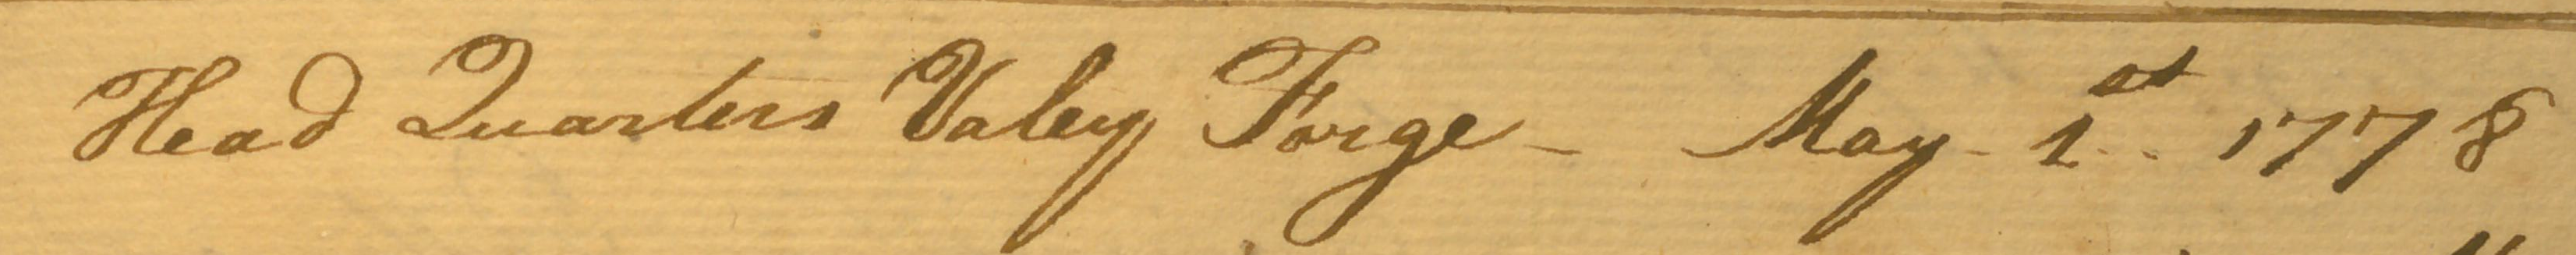Head Quarters Valey Forge- May 1^st. 1778
